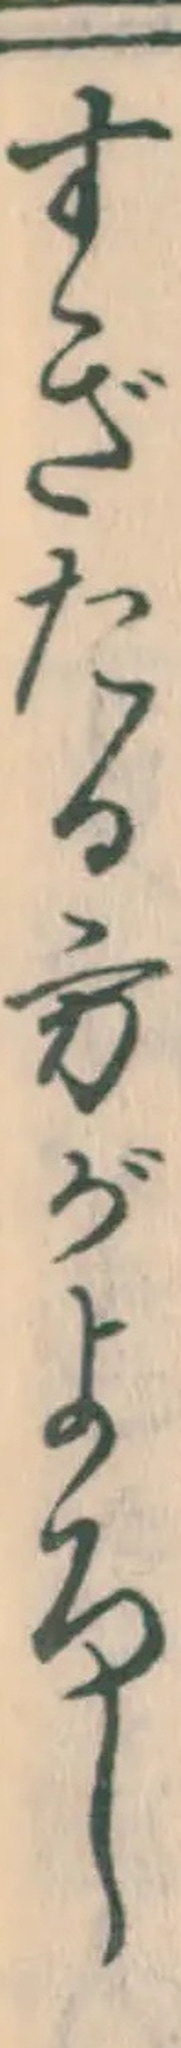すぎたる方がよろし
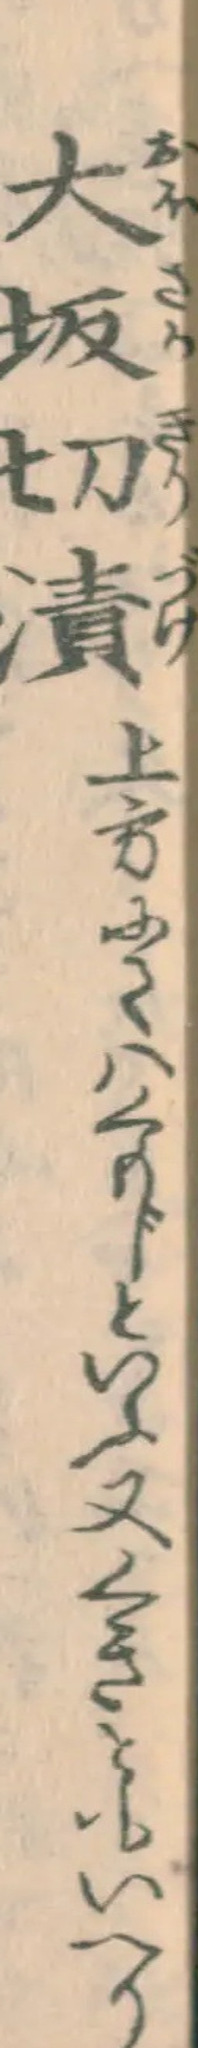大坂切漬上方にてはくもじといふ又くきともいへり
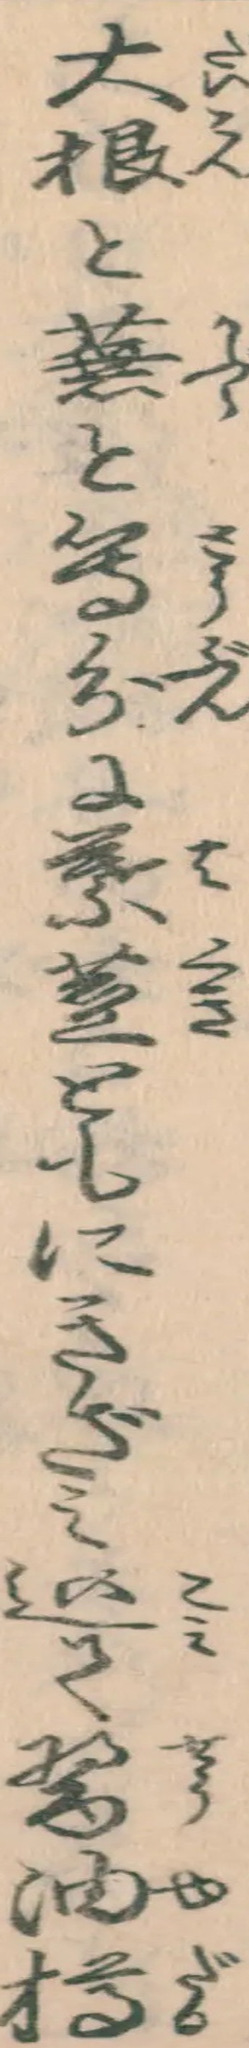大根と蕪と等分に葉茎ともにきざみ込て醤油樽
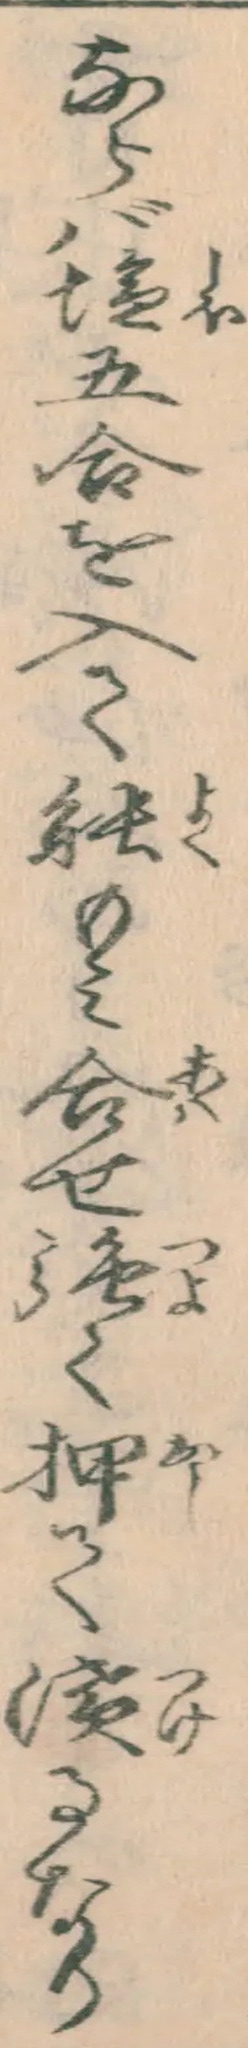ならば塩五合を入て能もみ合せ強く押て漬るなり
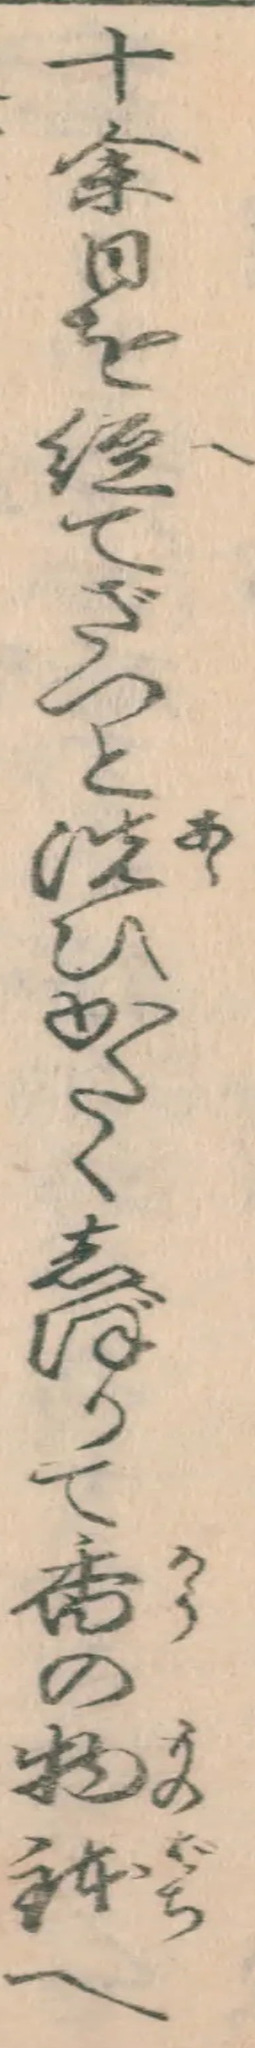十余日を経てざつと洗ひかたくしぼりて香の物鉢へ
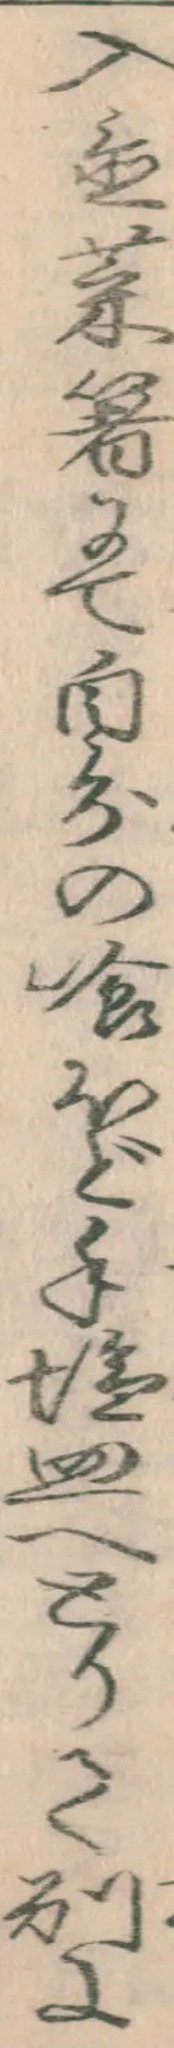入置菜箸にて自分の喰ほど手塩皿へとりて別に
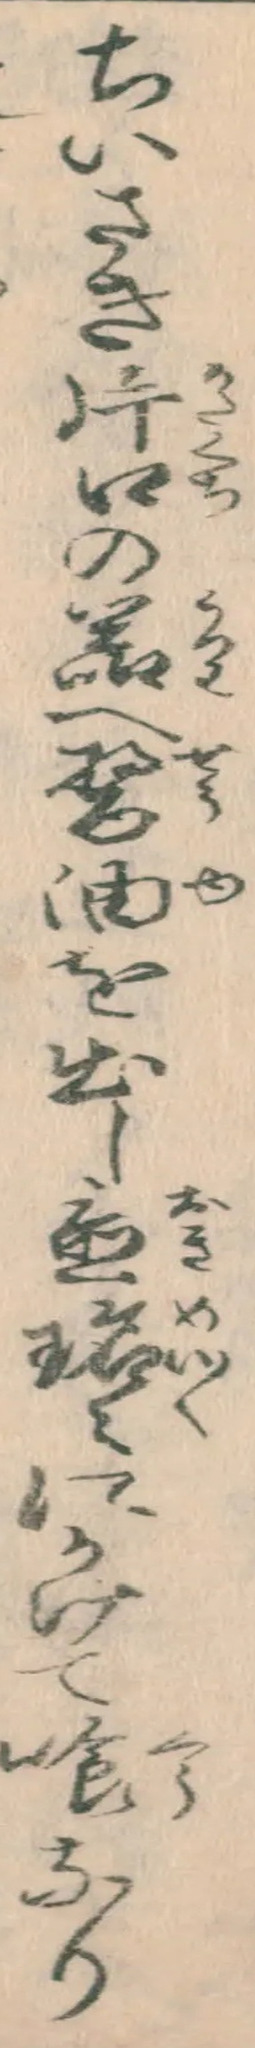ちいさき片口の器へ醤油を出し置銘々にかけて喰なり
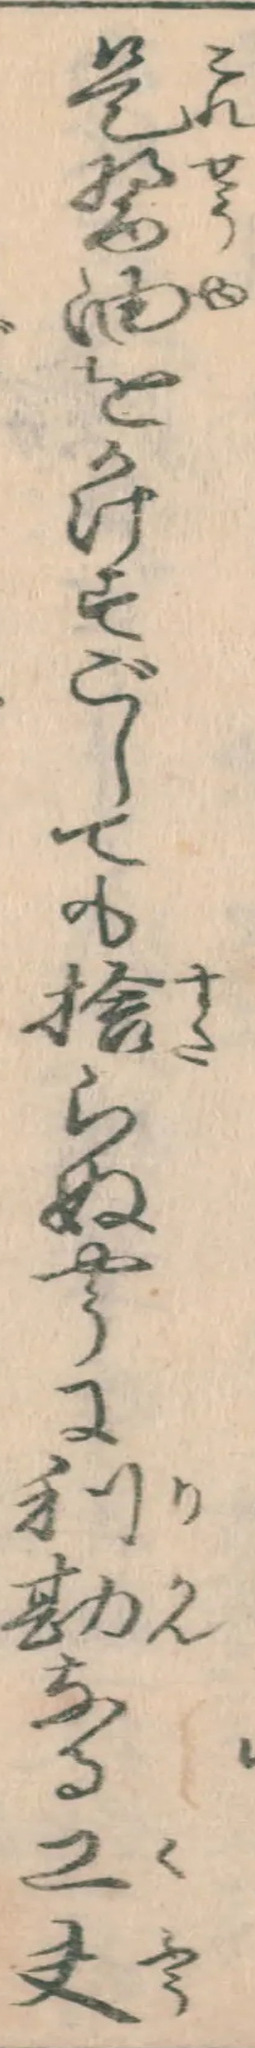是醤油をかけすごしても捨らぬやうに利勘なる工夫
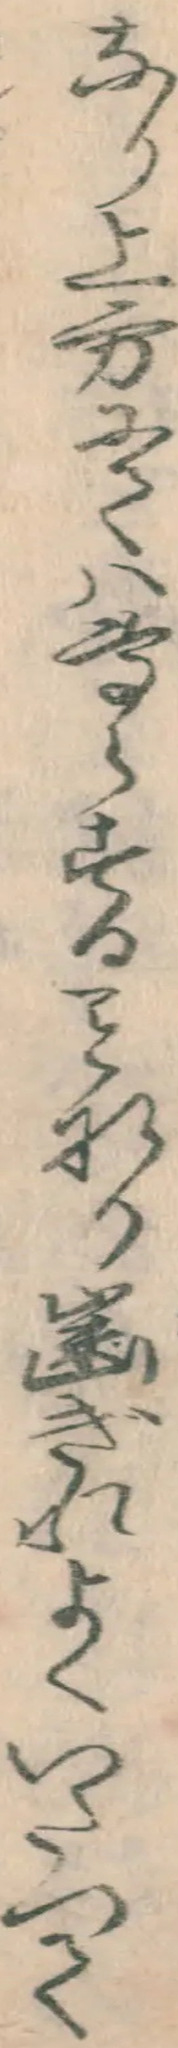なり上方にては専らすることなり歯ぎれよくいたつて
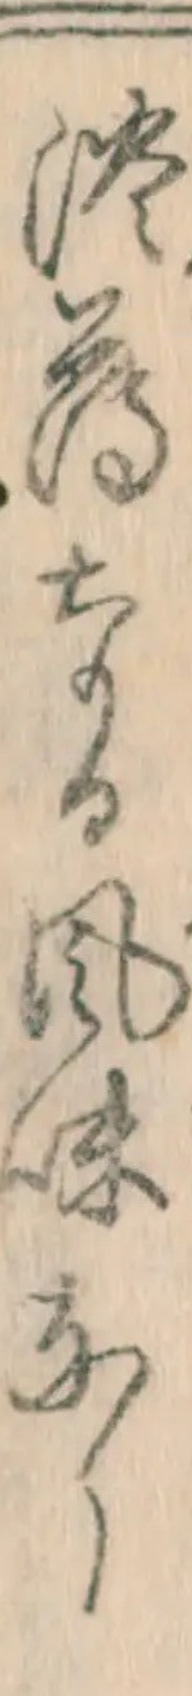淡薄なる風味なり

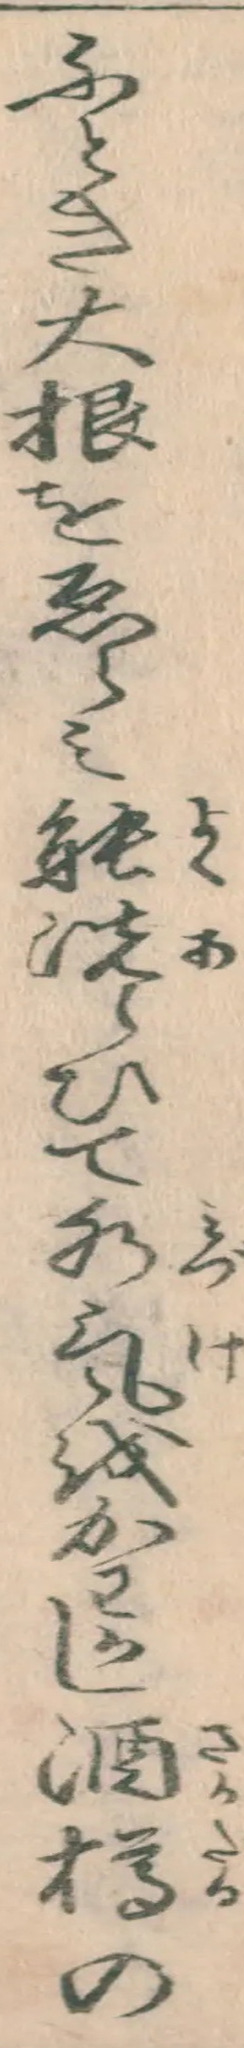ふとき大根をゑらみ能洗らひて水気をかわかし酒樽の
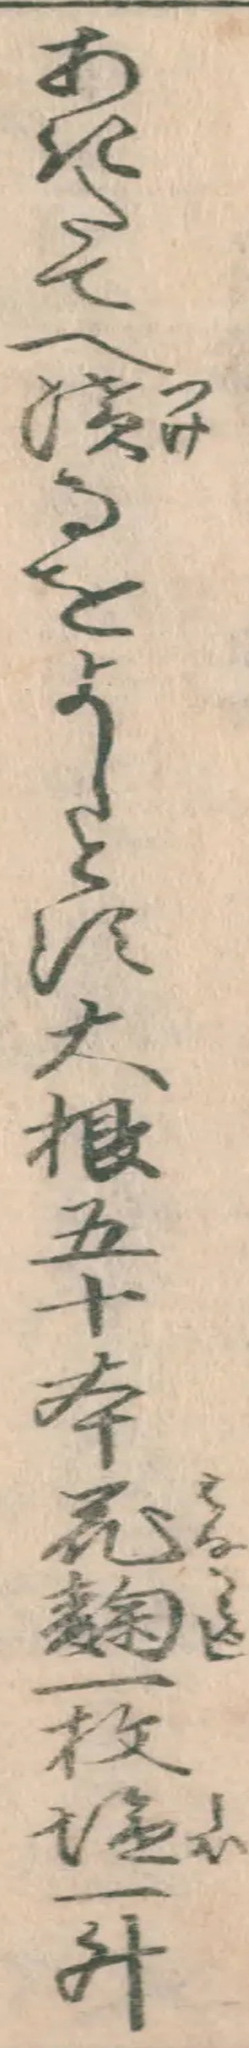あきたてへ漬るをよしとす大根五十本花麹一枚塩一升
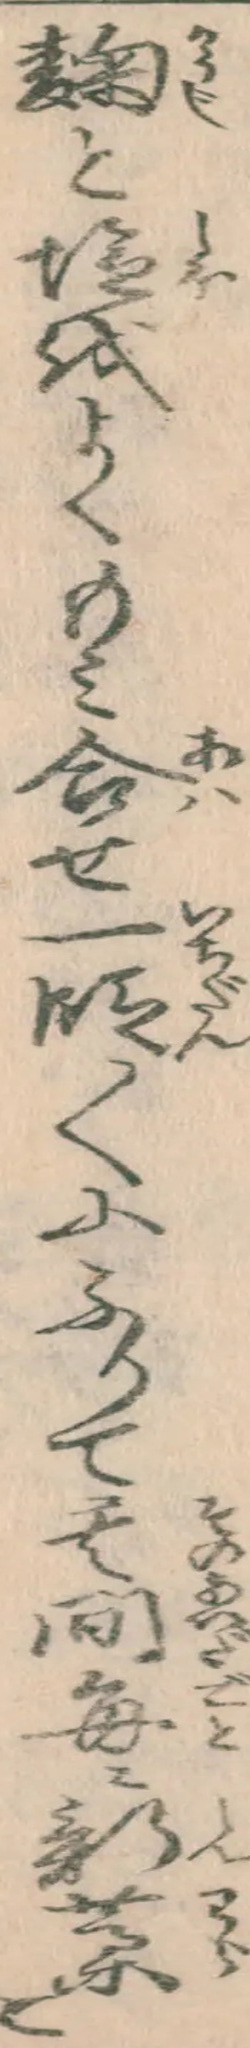麹と塩をよくもみ合せ一段〳〵にふりて其間毎に新藁を
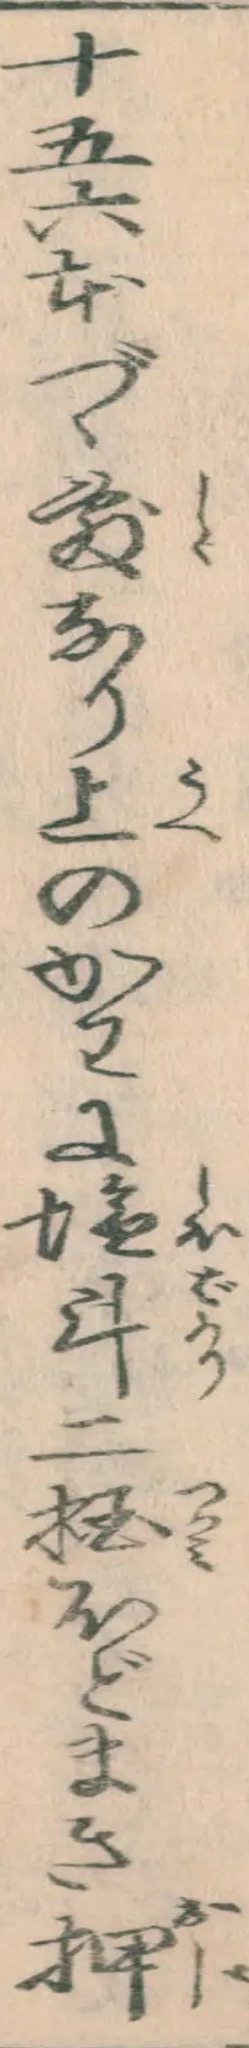十五六本づゝ敷なり上のかわに塩斗二掴ほどまき押
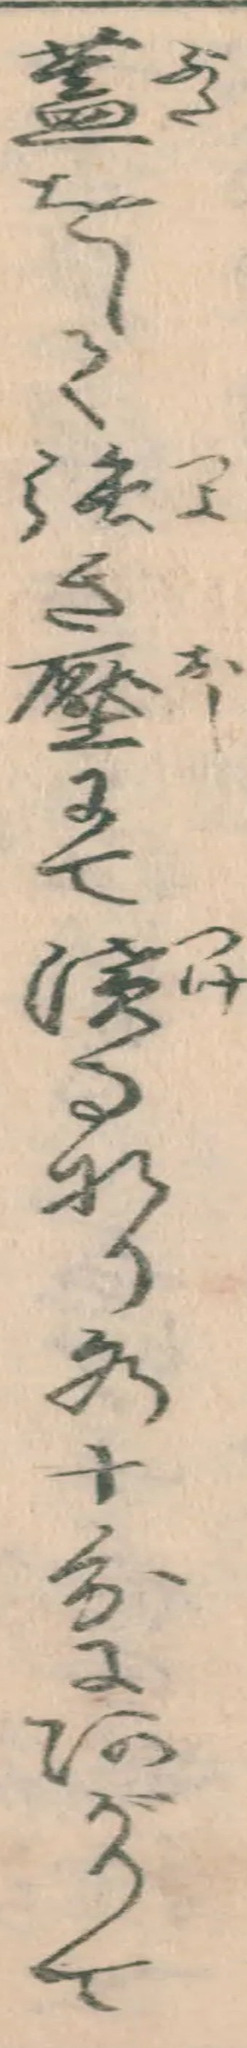蓋をして強き圧にて漬るなり水十分にあがりて
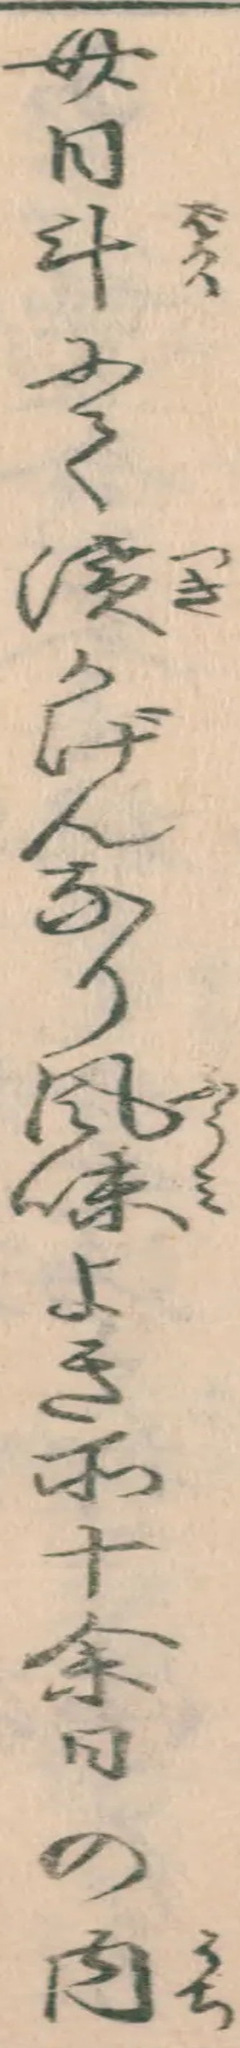廿日斗にて漬かげんなり風味よき所十余日の内
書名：四季漬物鹽嘉言
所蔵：国立国会図書館 National Diet Library, JAPAN
